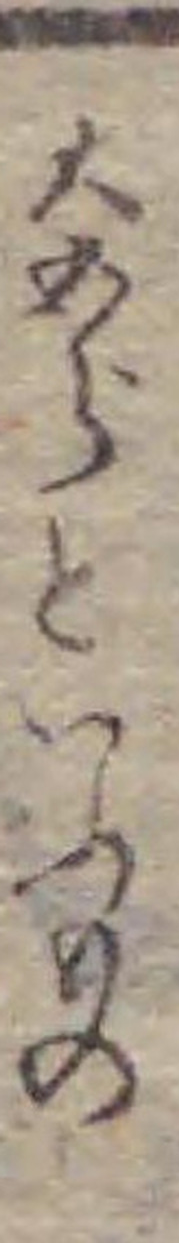代五郎といふもの
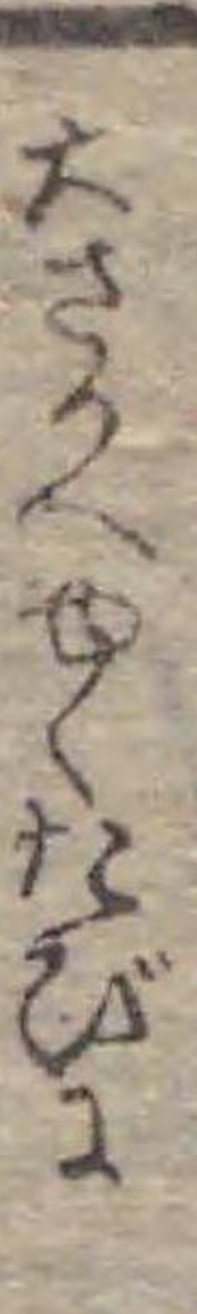大さかへゆくたびに
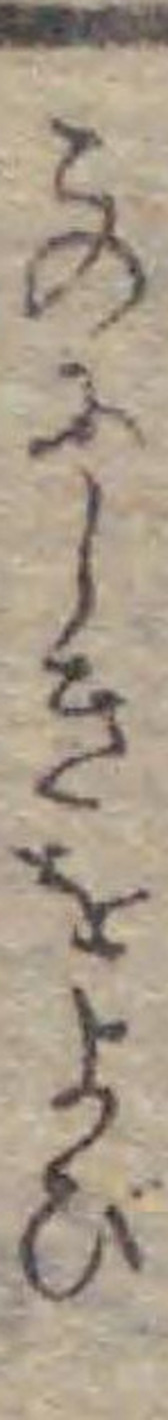このにしきをよび
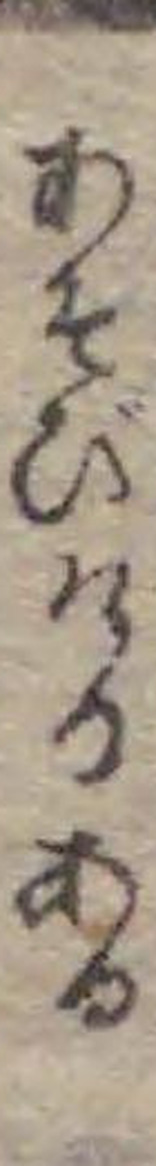あそびけるある
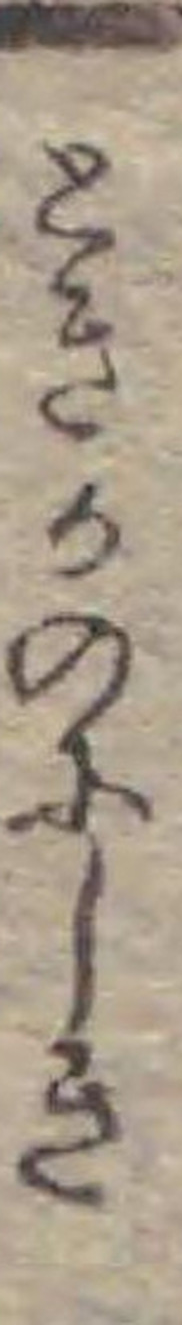ときかのにしき
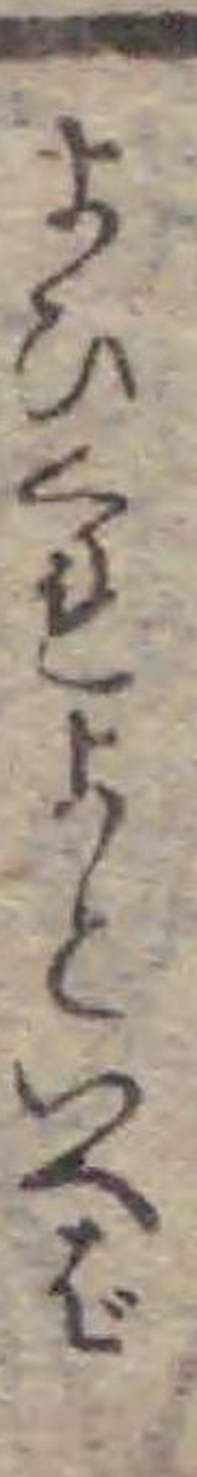よひくれよといへば
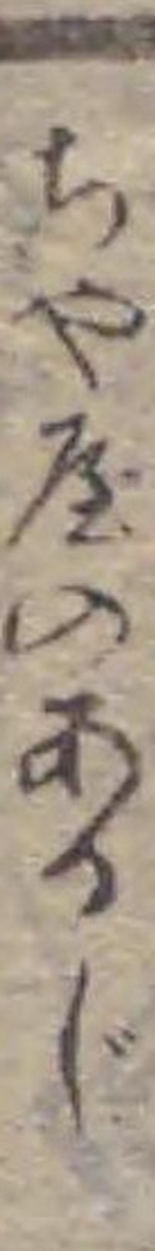ちや屋のあるじ
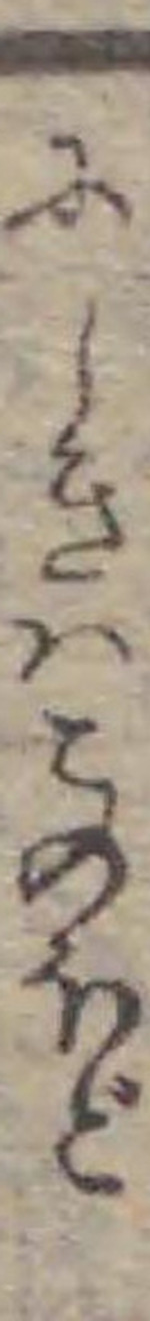にしきはこのほど
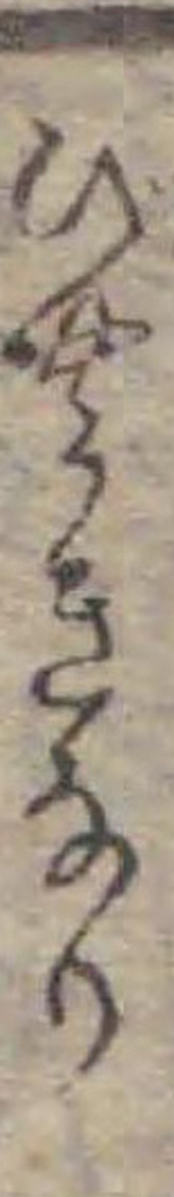びやうきなり
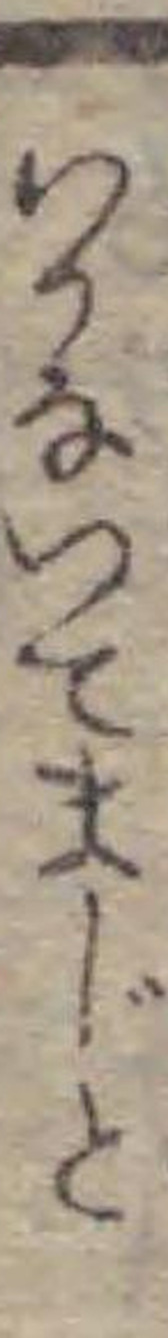いかないてまじと
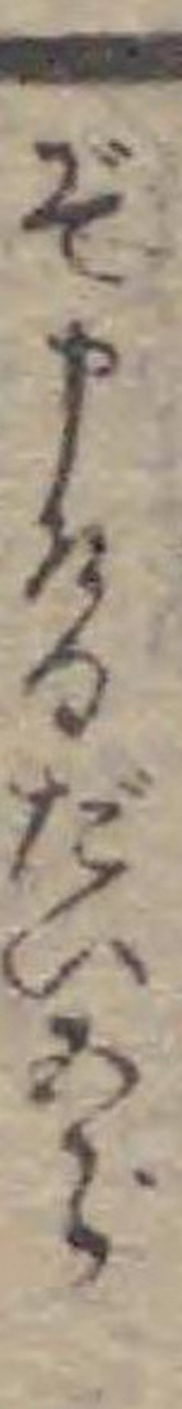ぞ申けるだい五郎
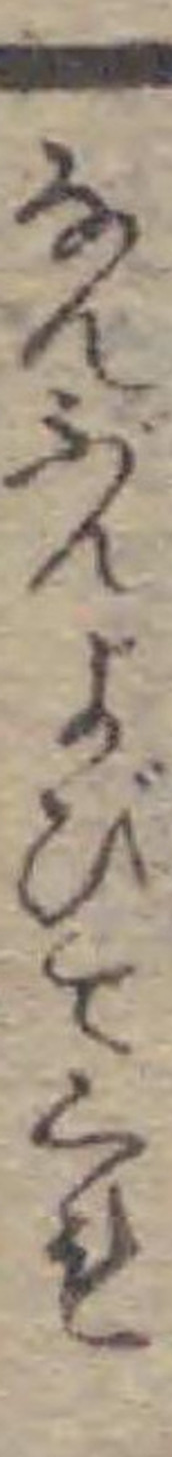なんぶんよびてくれ
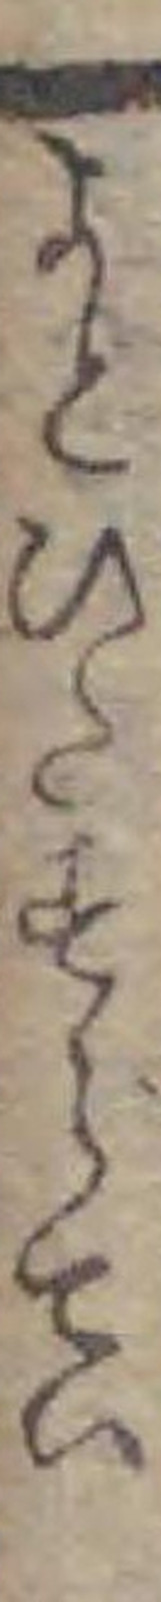よとひたすらてい
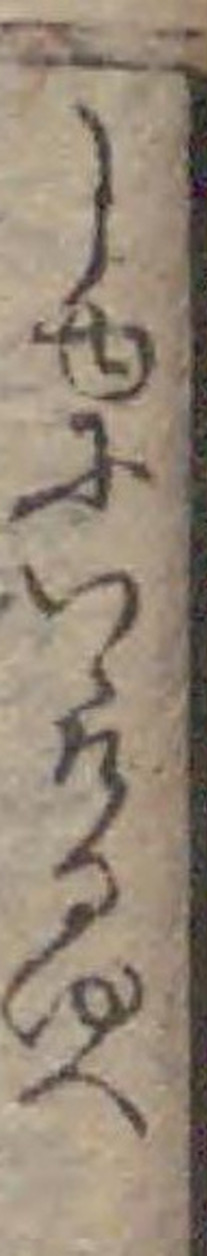しゆにいゝけるゆへ
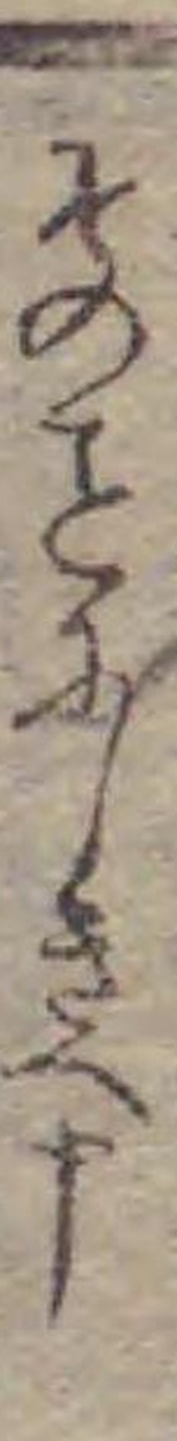そのことにしきへ申
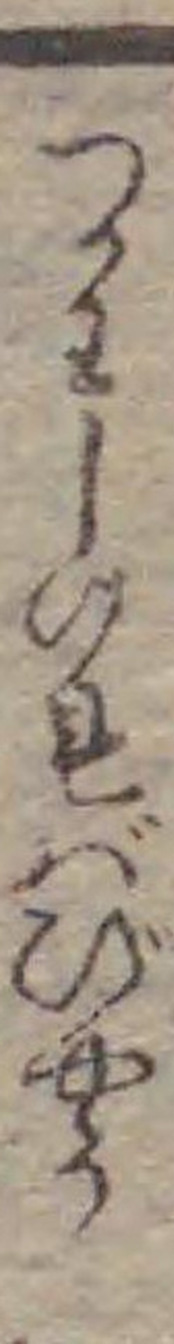つかわしいればびやう
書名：変化物春遊 : 2巻
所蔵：国立国会図書館 National Diet Library, JAPAN
